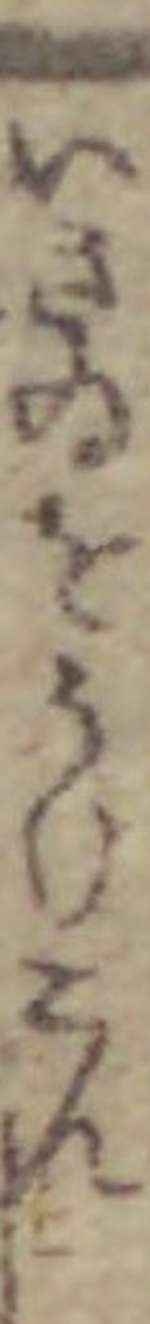いさゐをうけこん
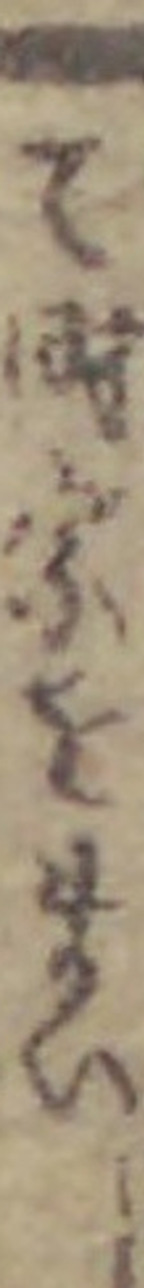て時宗をまい
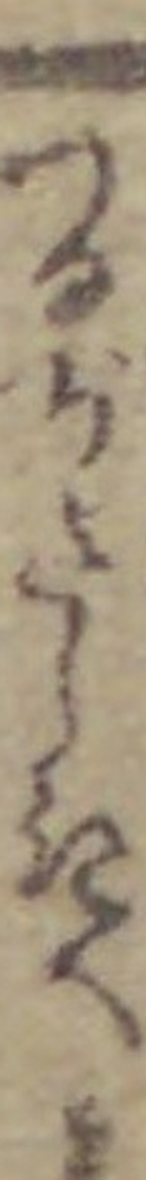つるがさしきへ
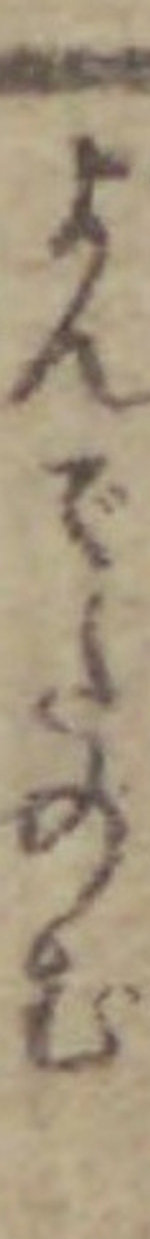よんでたのむ
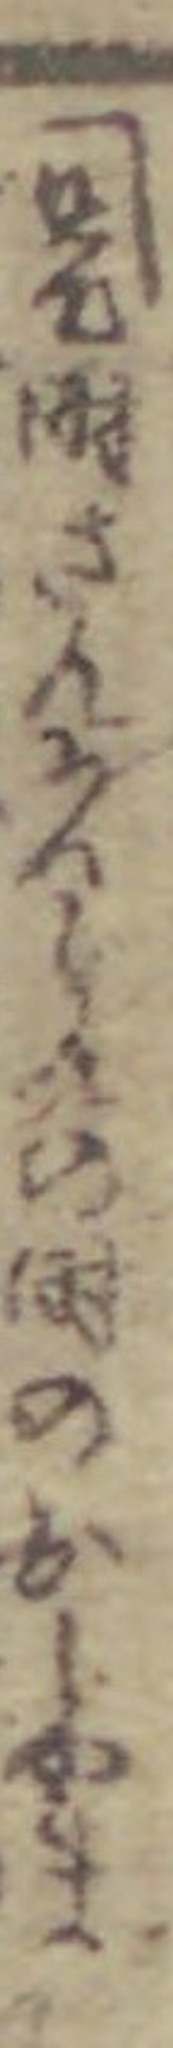「是時さんかんしんの時のおしやま
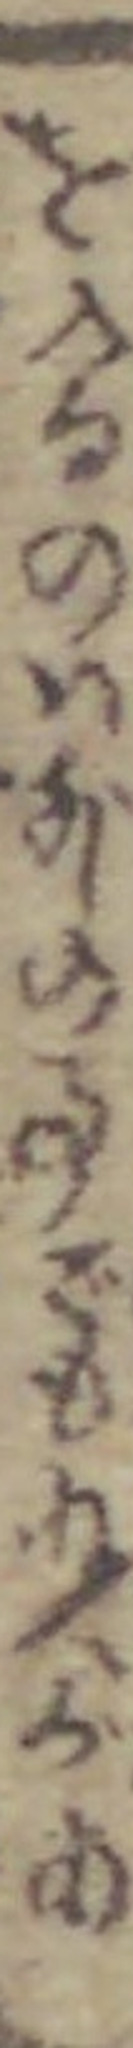を入るのは外の事でもねへがあ
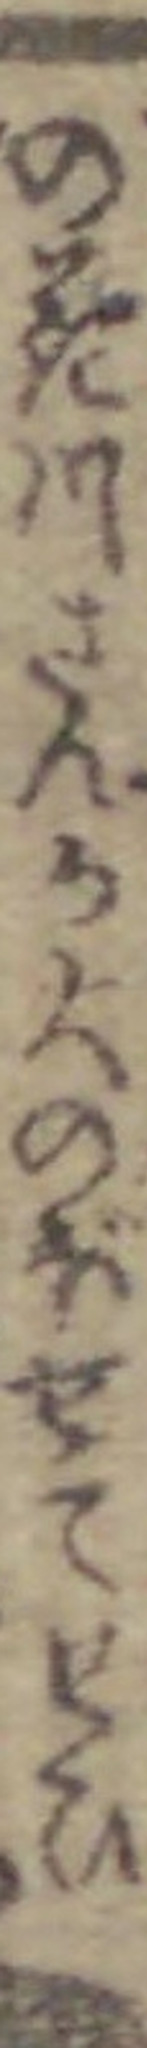の花川さんか大のぼせてせひ
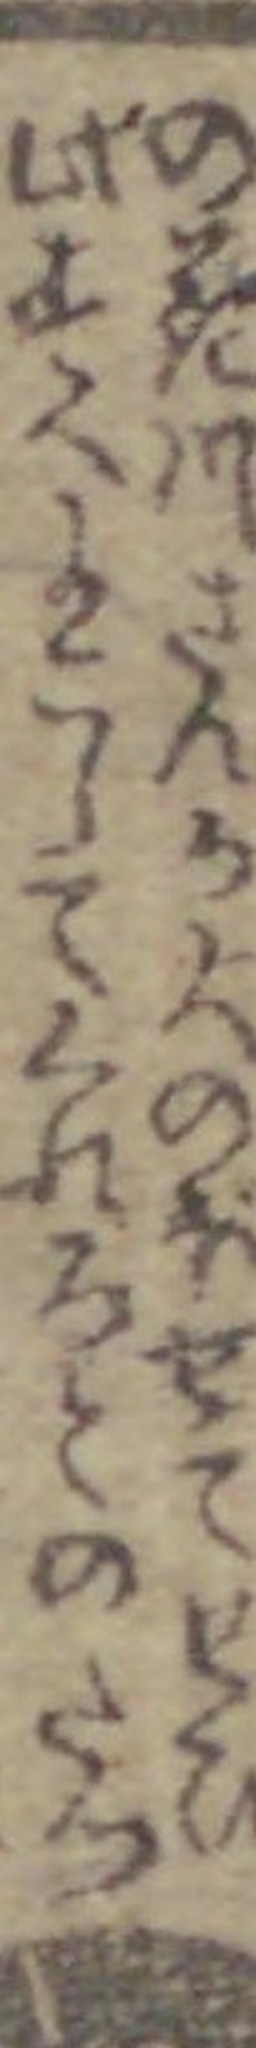此すへによこしてくれろとのたつ
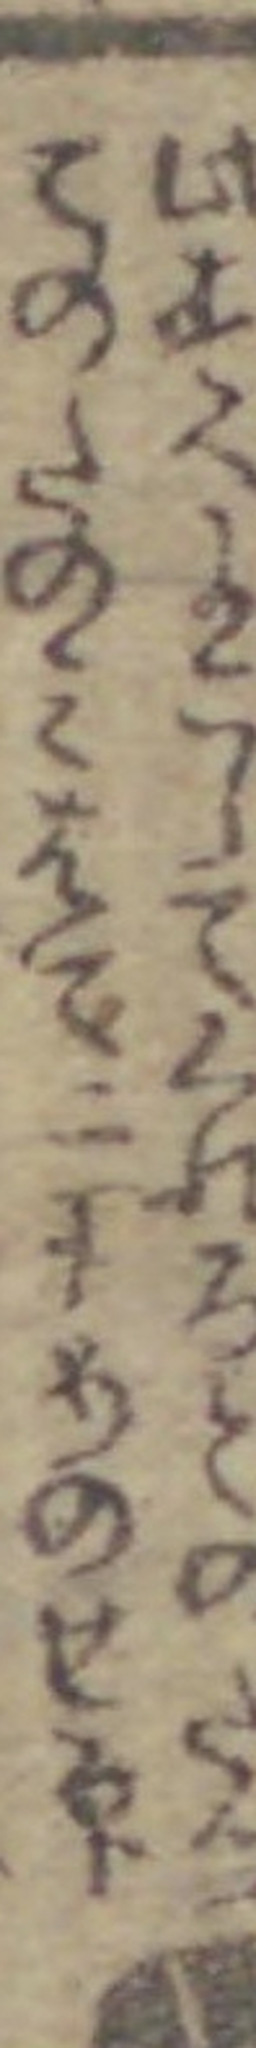てのたのみは二丁めのせ印
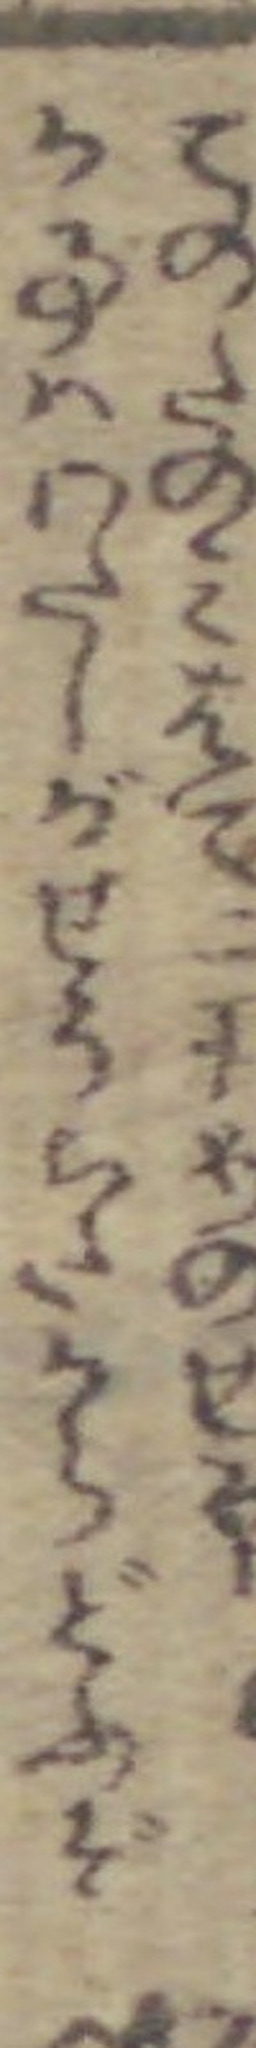か事はわたしがせうちたからどふぞ
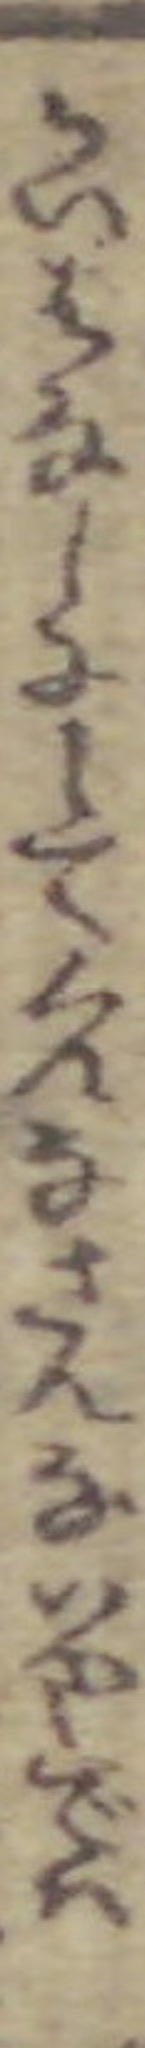かいはなしにしてくんなさんないやでは
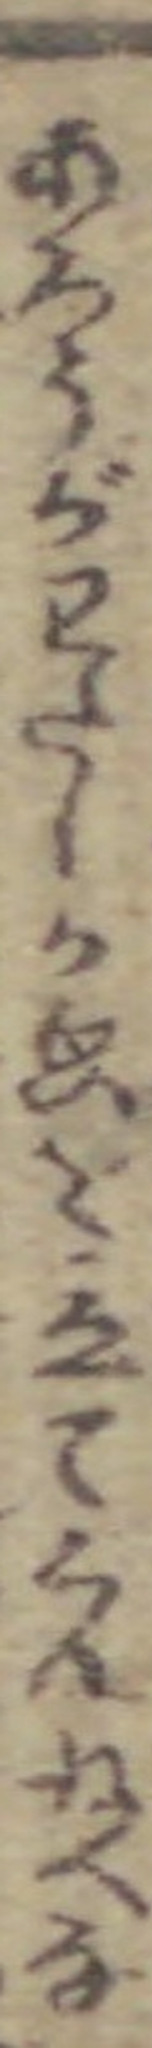あろうがわたしか顔を立てくんねへな
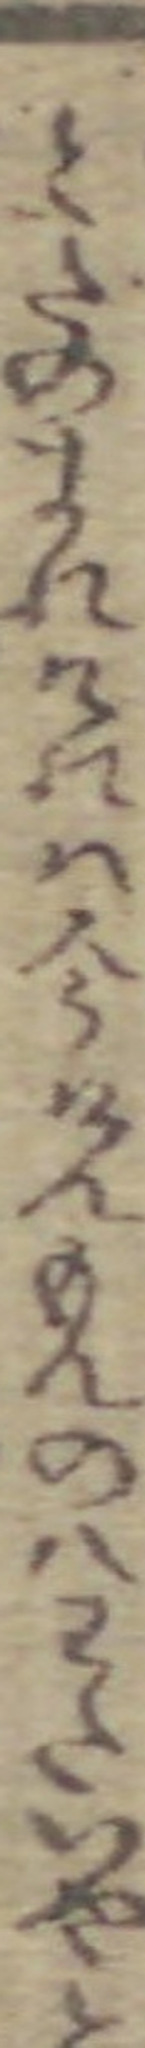とたのまれけれは今けんもんのは八わたいやとも
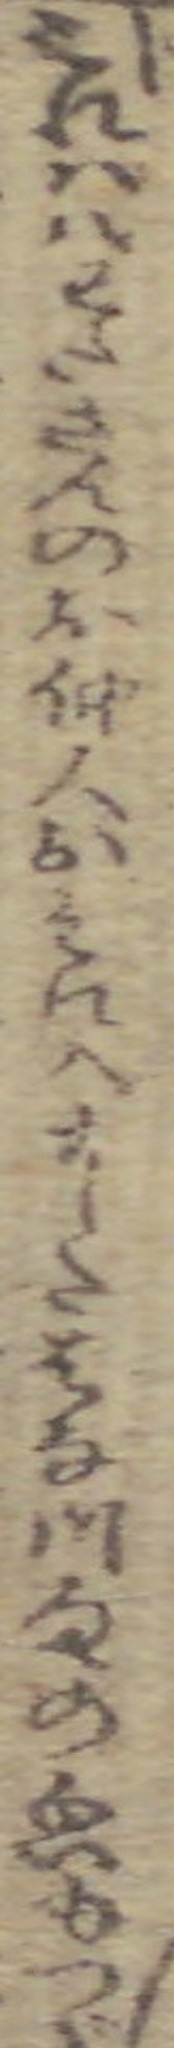「これは八わたさんのお仲人おそれ入ましたはな川さまの顔もつぶ
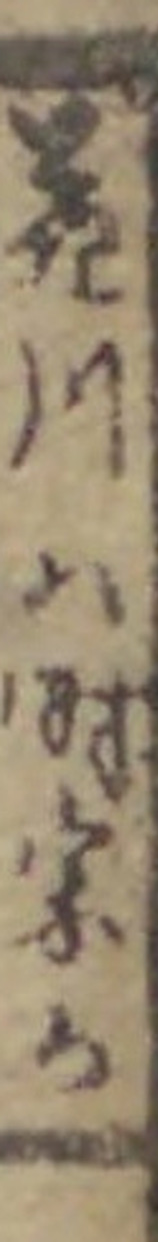花川は時宗に
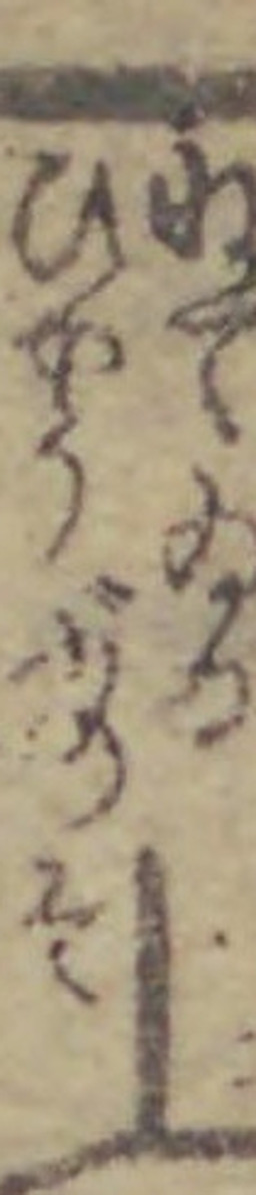ひやうぶのそ
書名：間似合嘘言曽我 3巻
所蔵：国立国会図書館 National Diet Library, JAPAN
